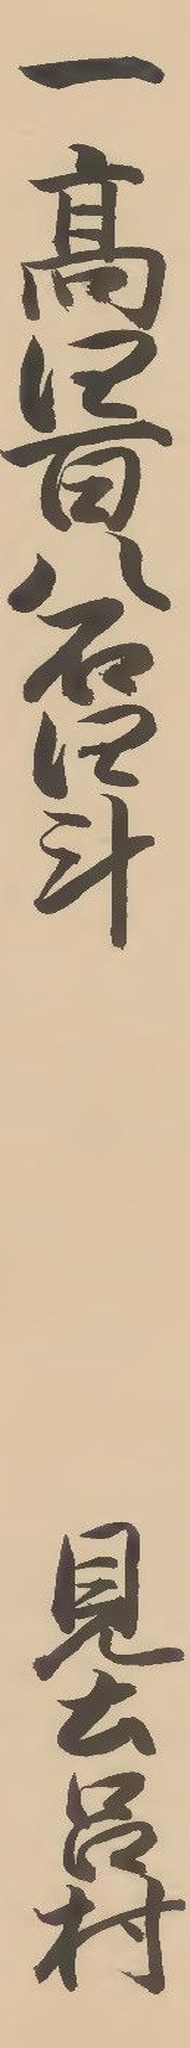一髙四百八石四斗見土呂村
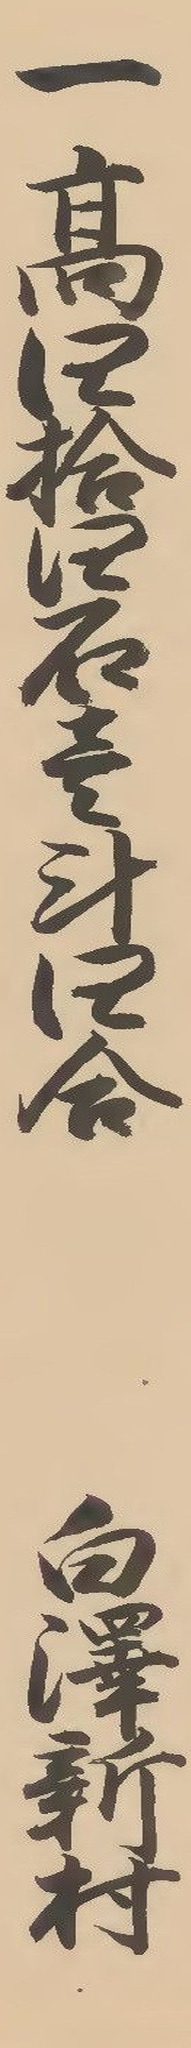一髙四拾四石壱斗四合白澤新村

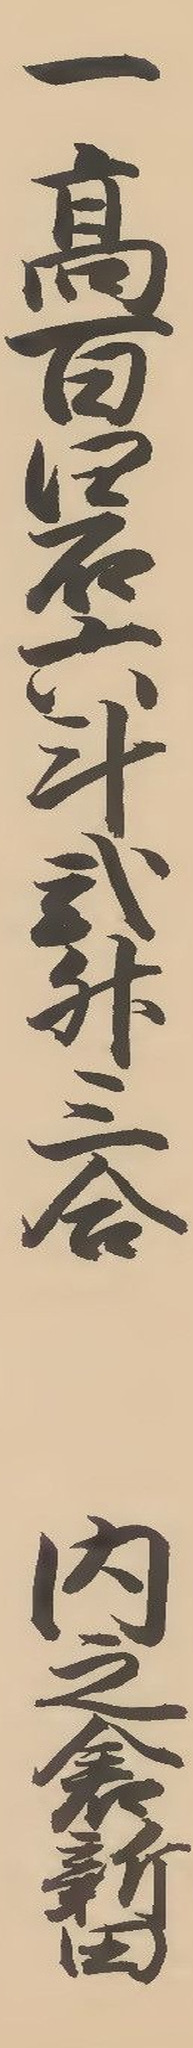一髙百四石六斗弐升三合内之倉新田
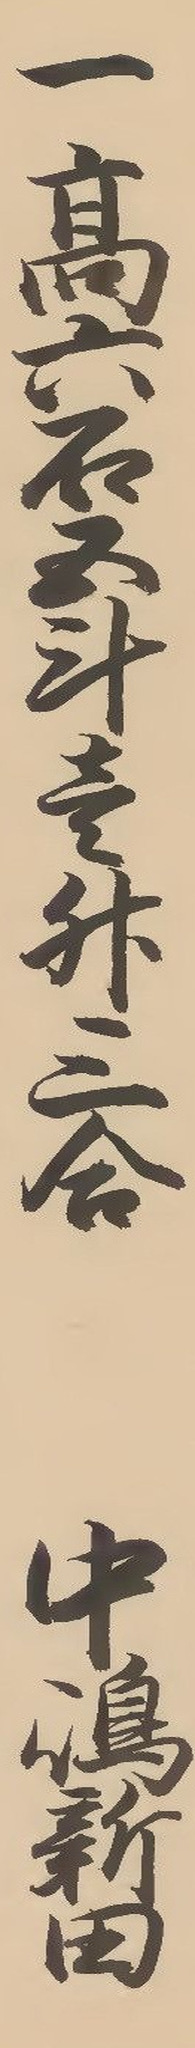一髙六石五斗壱升三合中嶋新田
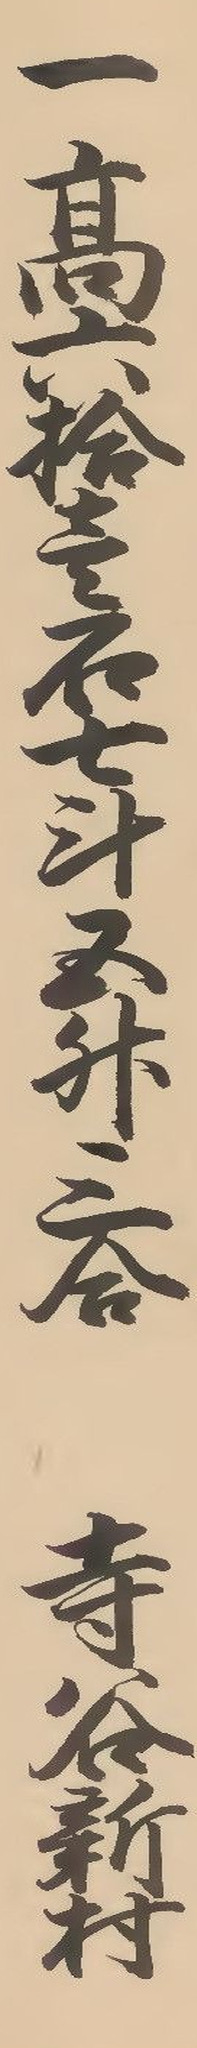一髙六拾壱石七斗五升三合寺谷新村
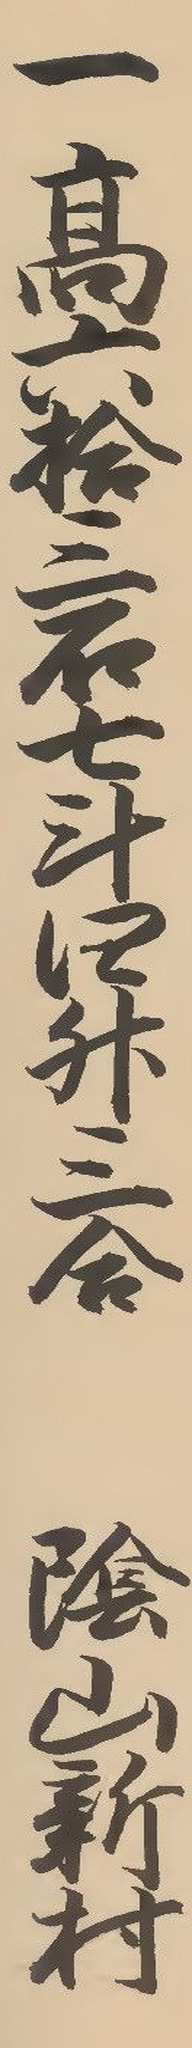一髙六拾三石七斗四升三合陰山新村
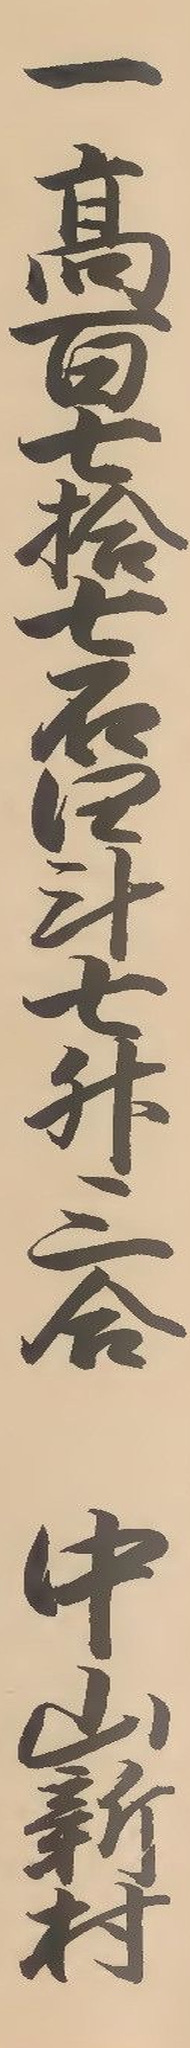一髙百七拾七石四斗七升三合中山新村
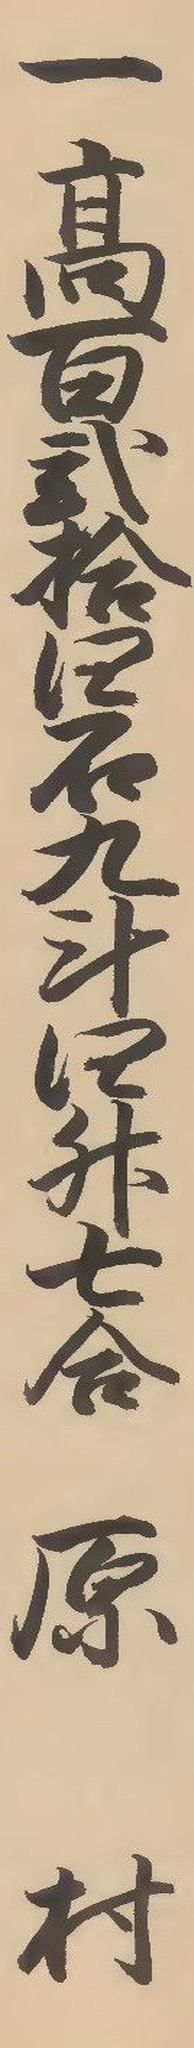一髙百弐拾四石九斗四升七合原村
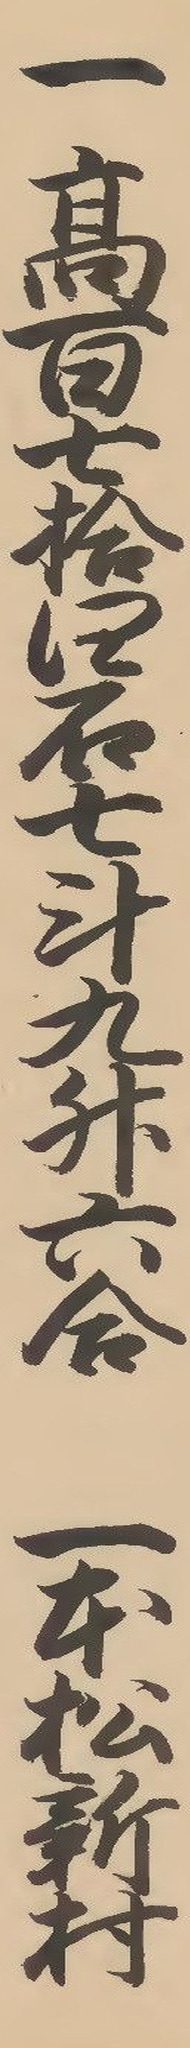一髙百七拾四石七斗九升六合一本松新村
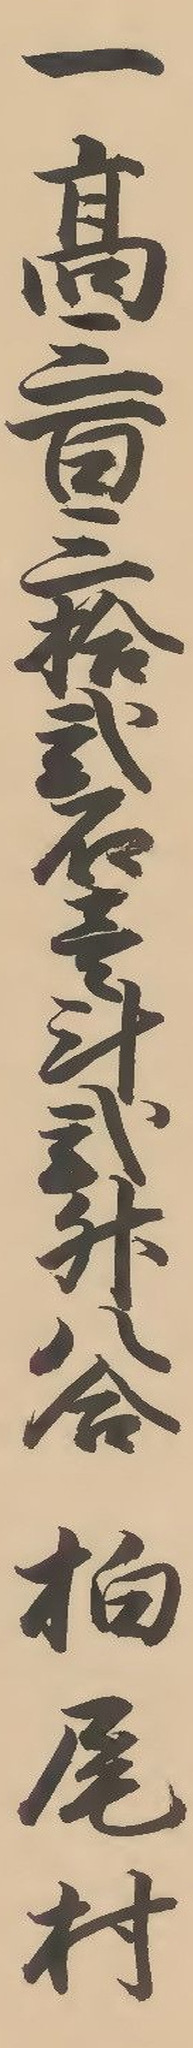一髙三百三拾弐石壱斗弐升八合柏尾村

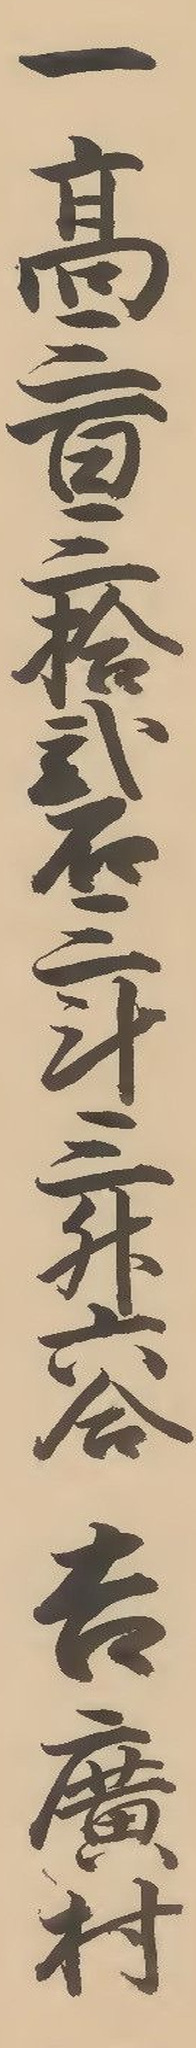一髙三百三拾弐石三斗三升六合吉廣村
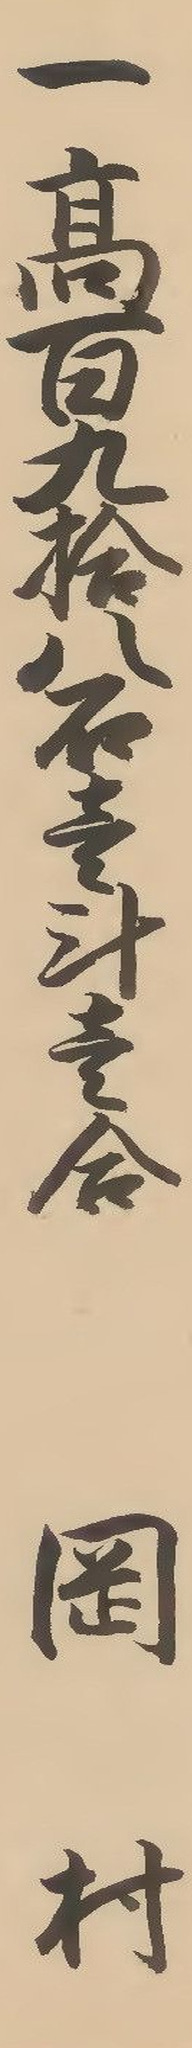一髙百九拾八石壱斗壱合岡村
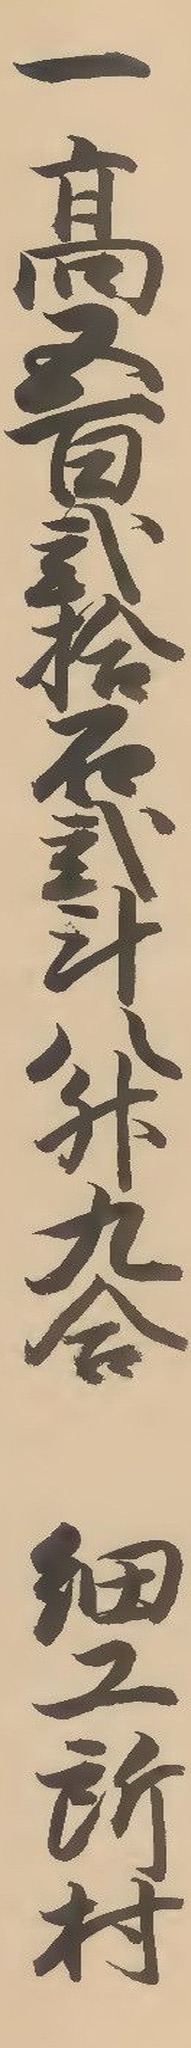一髙五百弐拾石弐斗八升九合細工所村
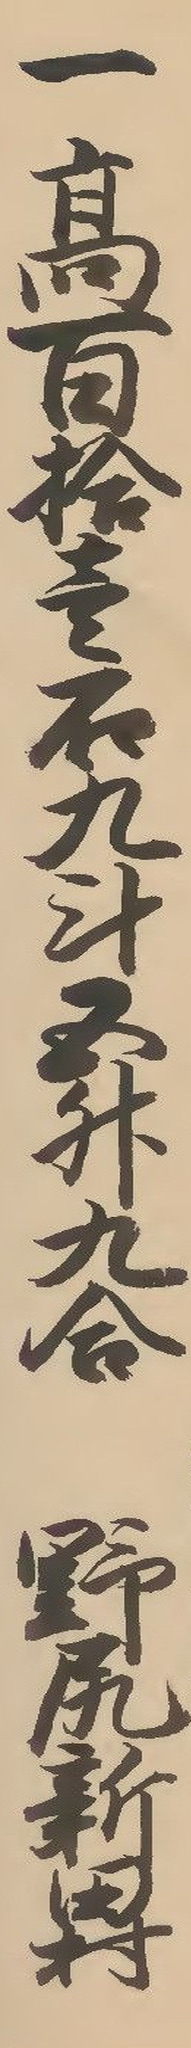一髙百拾壱石九斗五升九合野尻新田村
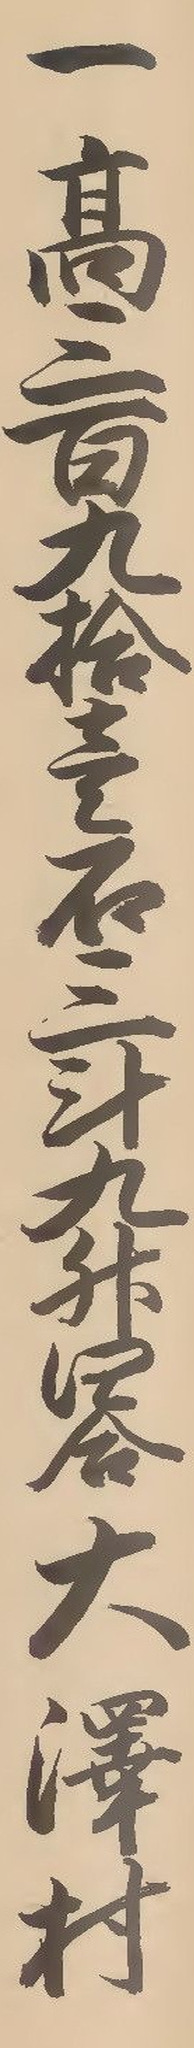一髙三百九拾壱石三斗九升四合大澤村
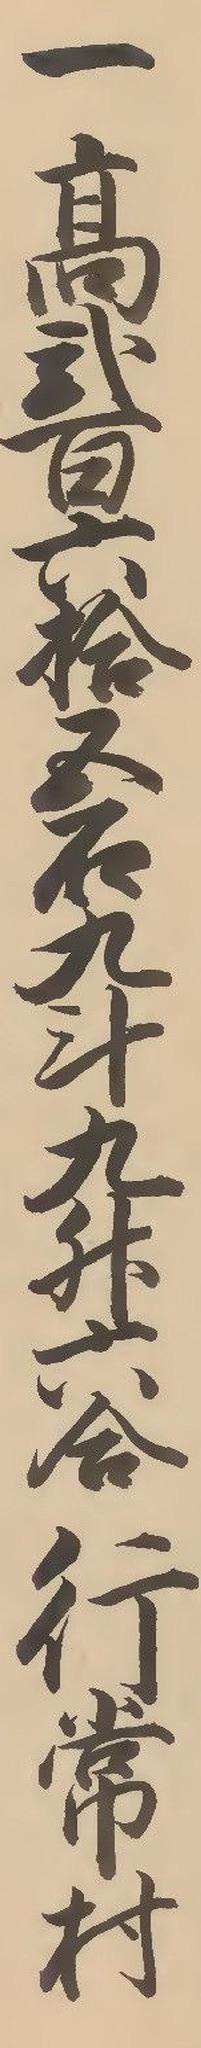一髙弐百六拾五石九斗九升六合行常村
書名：播磨国郷帳
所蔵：国立公文書館 National Archives of Japan
